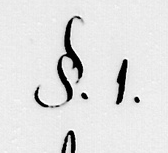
§. 1.
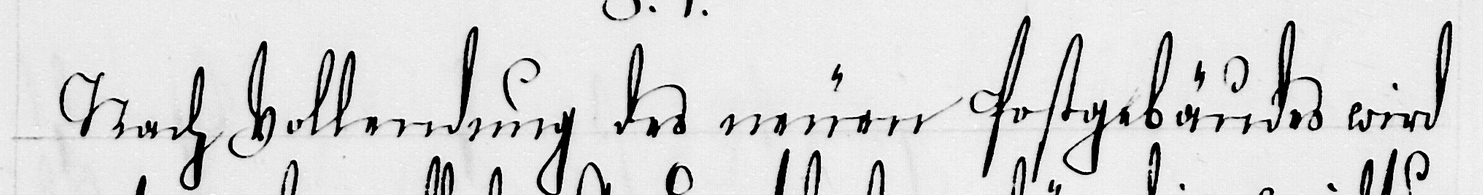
Nach Vollendung des neuen Postgebäudes wird
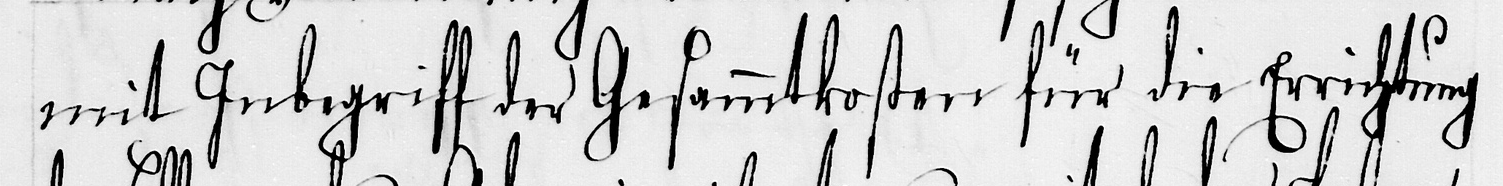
mit Inbegriff der Gesammtkosten für die Erricht¬
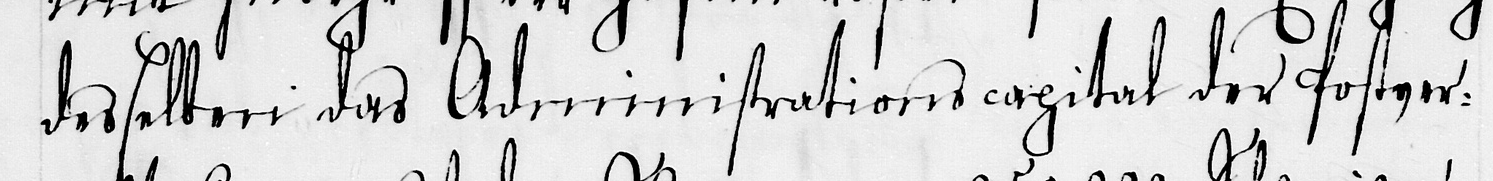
desselben das Administrationscapital der Postver¬
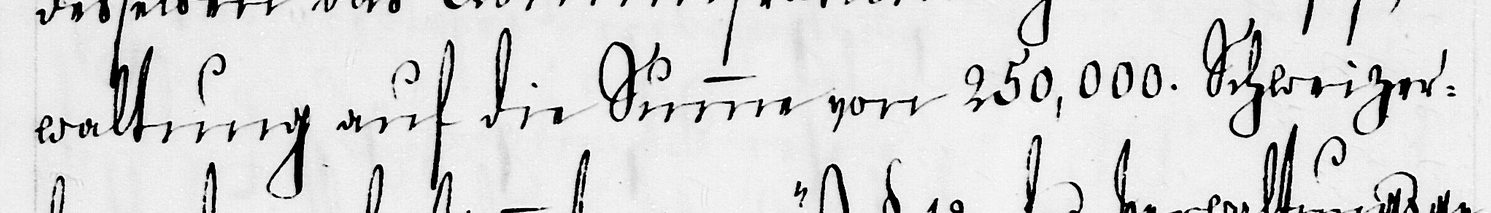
waltung auf die Summe von 250,000. Schweizer¬
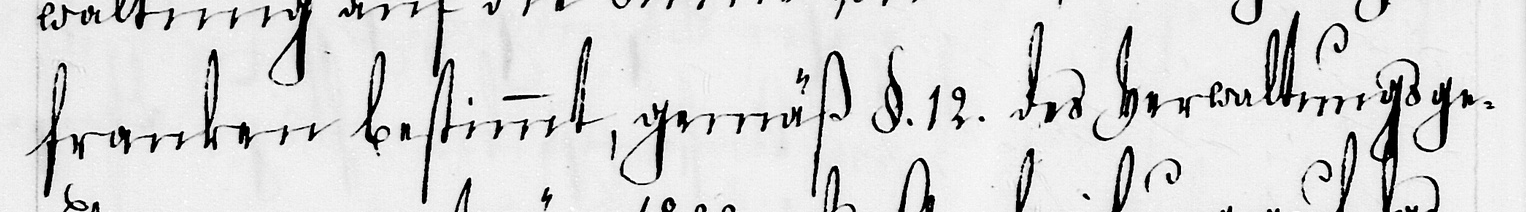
franken bestimmt, gemäß §. 12. des Verwaltungsge¬
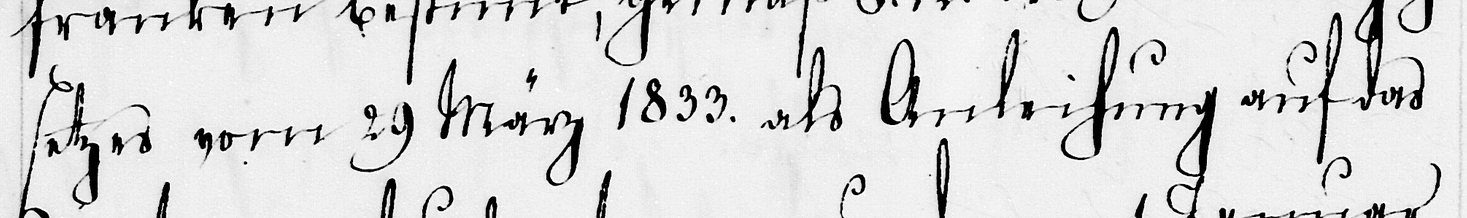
setzes vom 29 März 1833. als Anleihung auf das
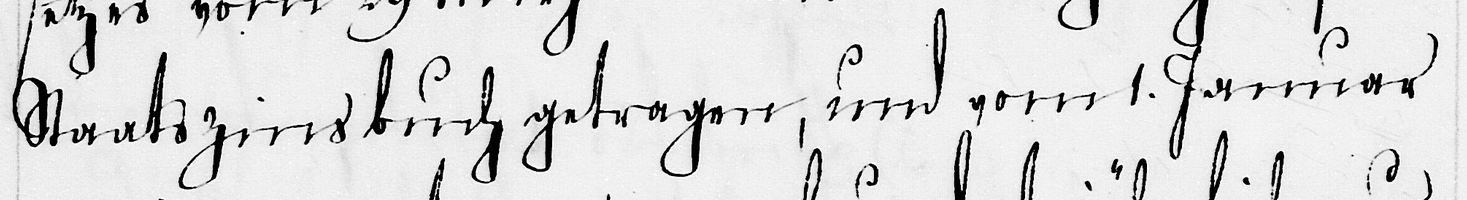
Staatszinsbuch getragen, und vom 1. Januar
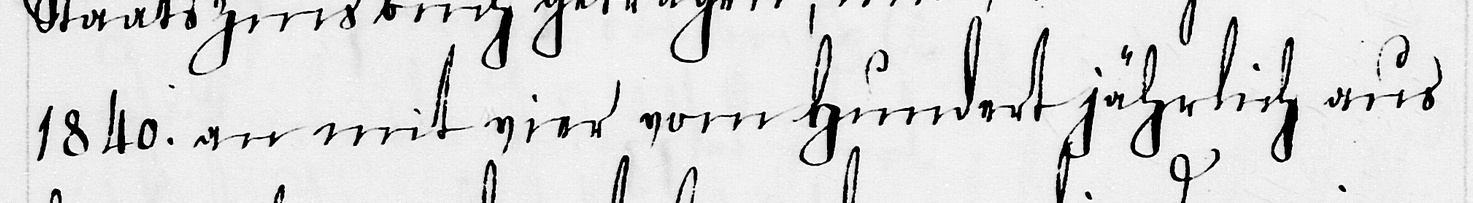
1840. an mit vier vom Hundert jährlich aus
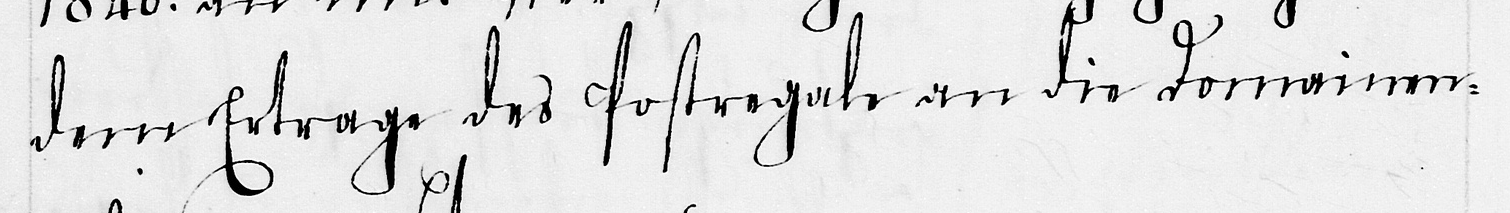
dem Ertrage des Postregale an die Domainen¬
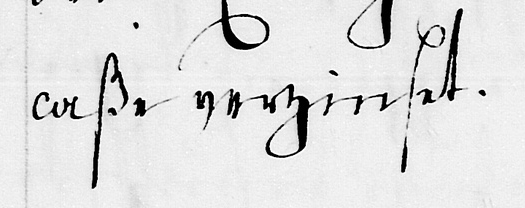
caße verzinset.
